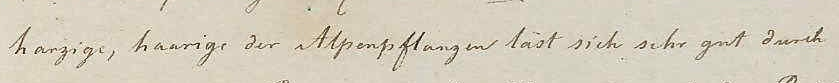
harzige, haarige der Alpenpflanzen läst sich sehr gut durch
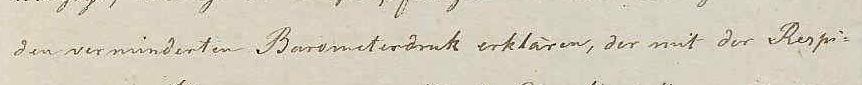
den verminderten Barometerdruk erklären, der mit der Respi-
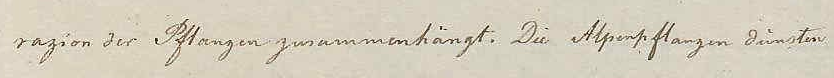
razion der Pflanzen zusammenhängt. Die Alpenpflanzen dünsten
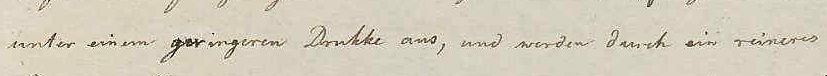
unter einem geringeren Drukke aus, und werden durch ein reineres
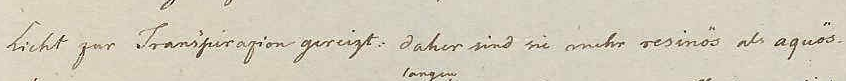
Licht zur Transspirazion gereizt: daher sind sie mehr resinös als aquös.
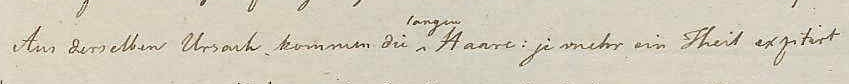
Aus derselben Ursach kommen die langen Haare: je mehr ein Theil exzitirt
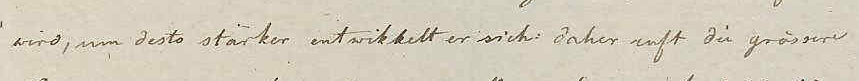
wird, um desto stärker entwikkelt er sich: daher ruft die grössere
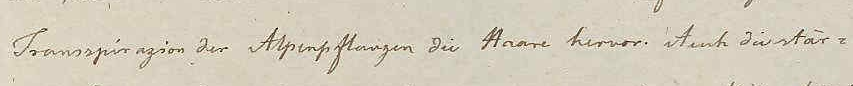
Transspirazion der Alpenpflanzen die Haare hervor. Auch die stär-
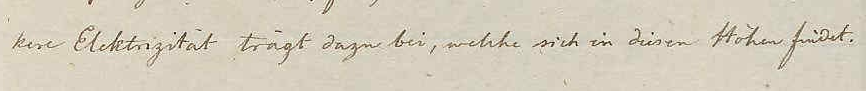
kere Elektrizität trägt dazu bei, welche sich in diesen Höhen findet.
